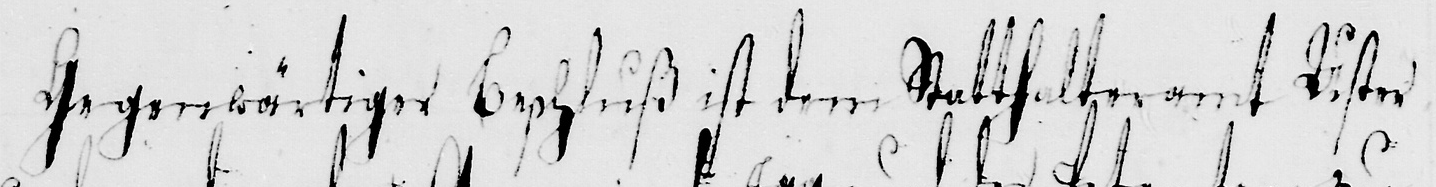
Gegenwärtiger Beschluß ist dem Statthalteramt Uster
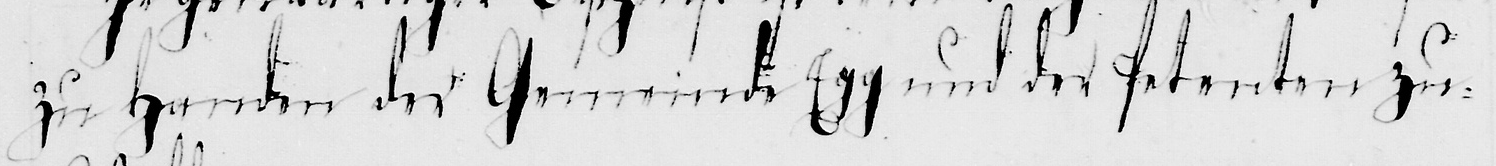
zu Handen der Gemeinde Egg und der Petenten zu¬
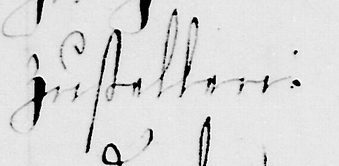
zustellen.
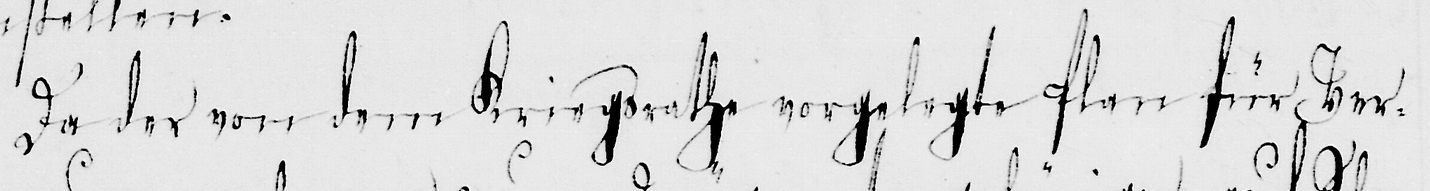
Da der von dem Kriegsrathe vorgelegte Plan für Ver¬
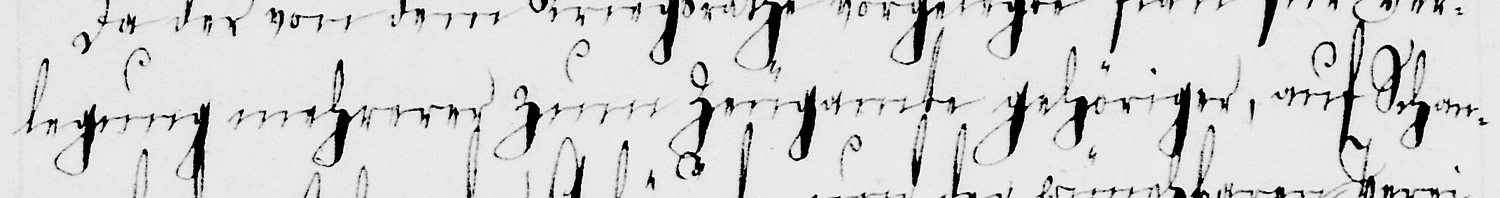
legung mehrerer zum Zeugamte gehöriger, auf Schan¬
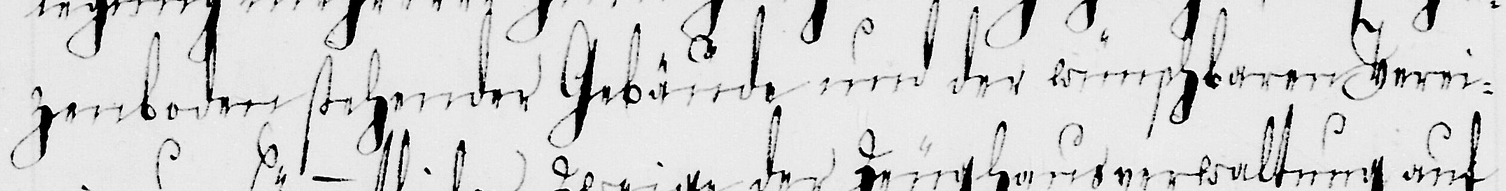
zenboden stehender Gebäude und der wünschbaren Verei¬
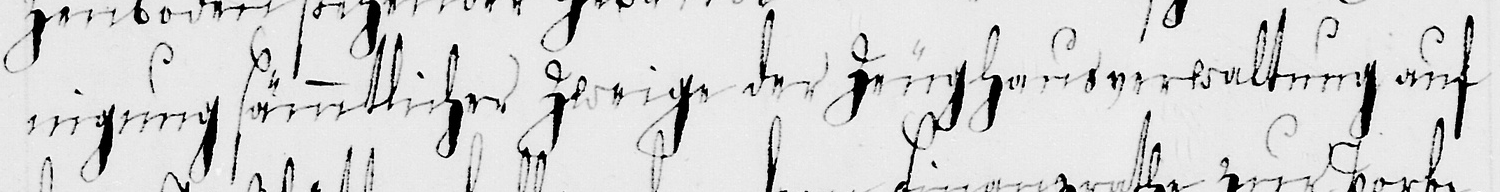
nigung sämmtlicher Zweige der Zeughausverwaltung auf
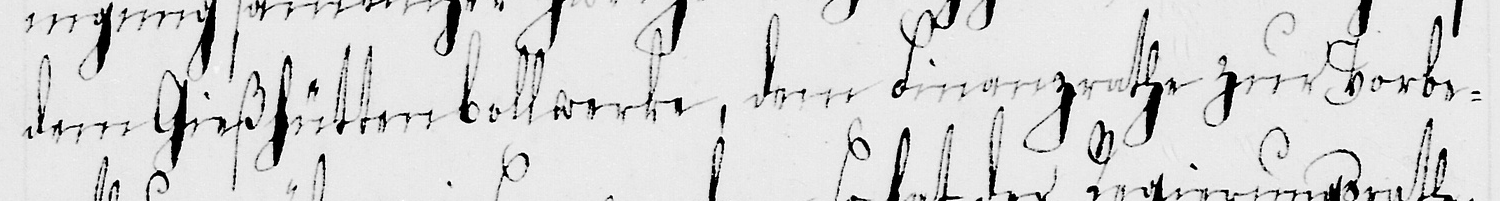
dem Gießhüttenbollwerke, dem Finanzrathe zur Vorbe¬
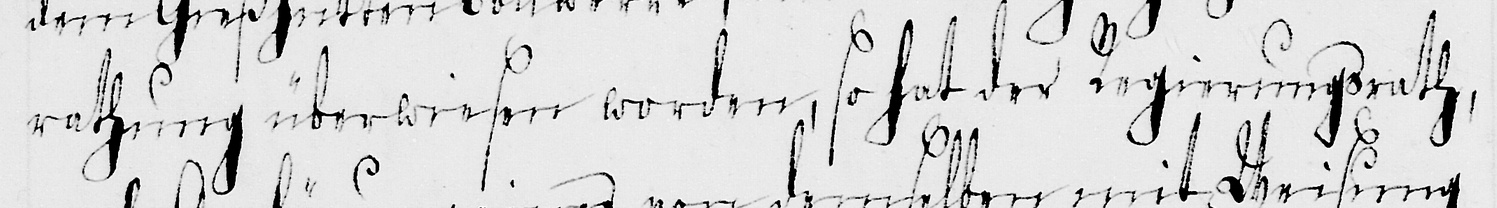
rathung überwiesen worden, so hat der Regierungsrath,
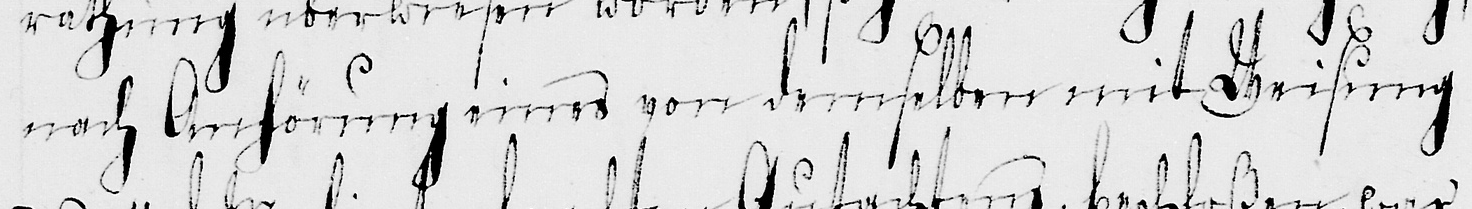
nach Anhörung eines von demselben mit Weisung
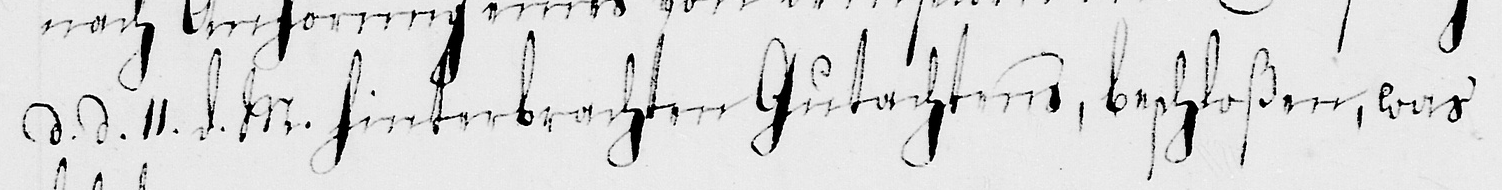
d. 11. d. M. hinterbrachten Gutachtens, beschloßen, was
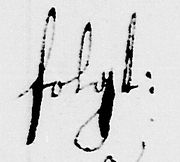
folgt:
